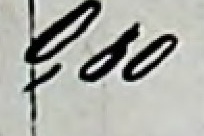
0,80
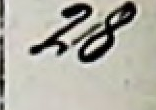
28
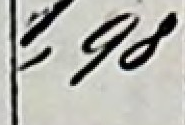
1,98
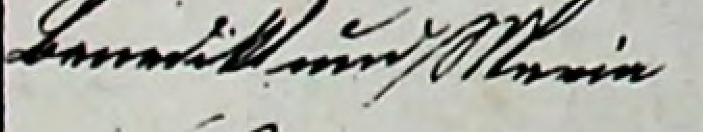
Benedikt und Maria
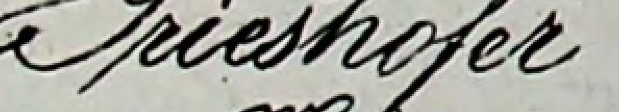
Grieshofer
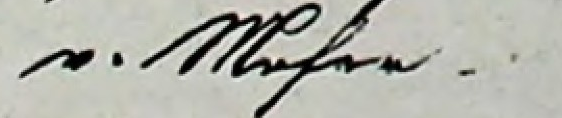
v. Moser
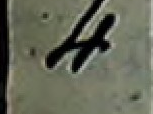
4
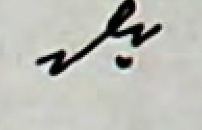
do
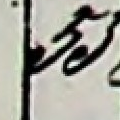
55
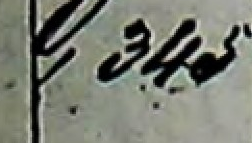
0,345
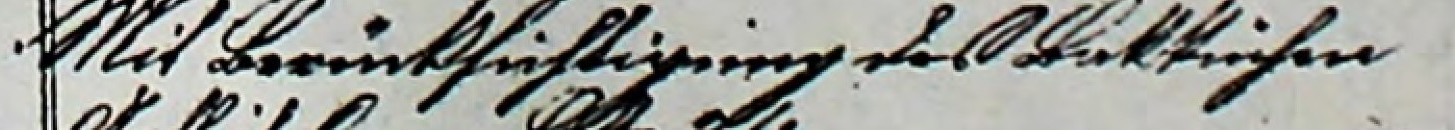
Mit Berücksichtigung des Bakküchen
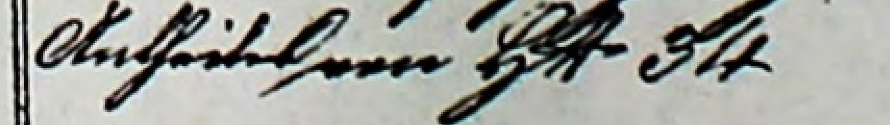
Antheiles von H? 34
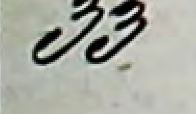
33
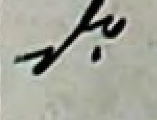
do
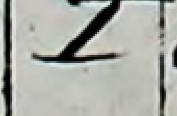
I
